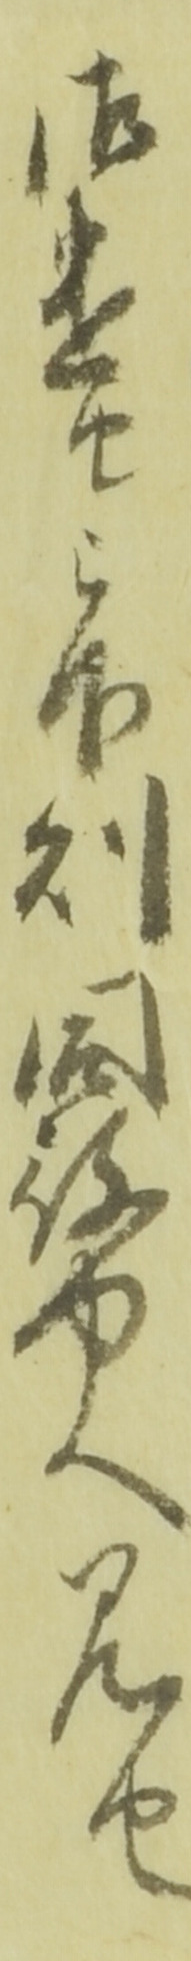御遣申候被下則同役中へ見セ
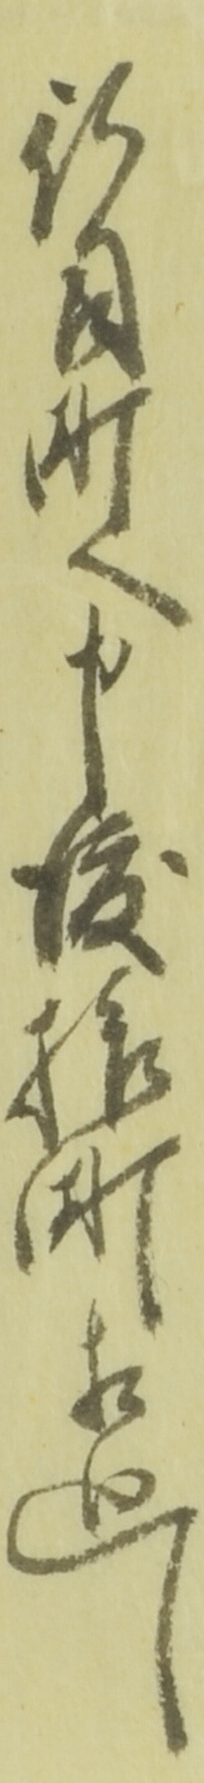行司町へ申渡拾町相廻し
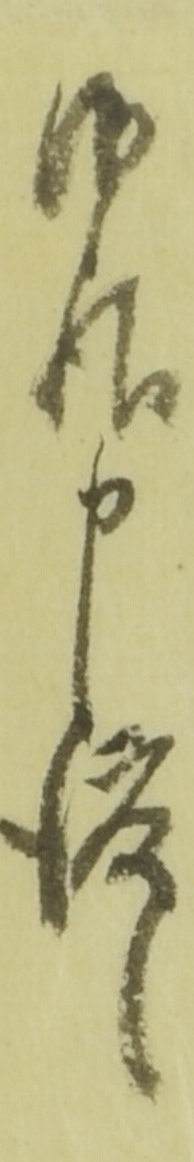候様申渡候
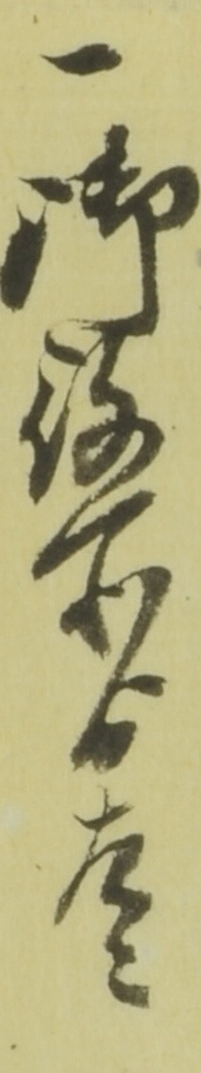一御役所ゟ左ニ
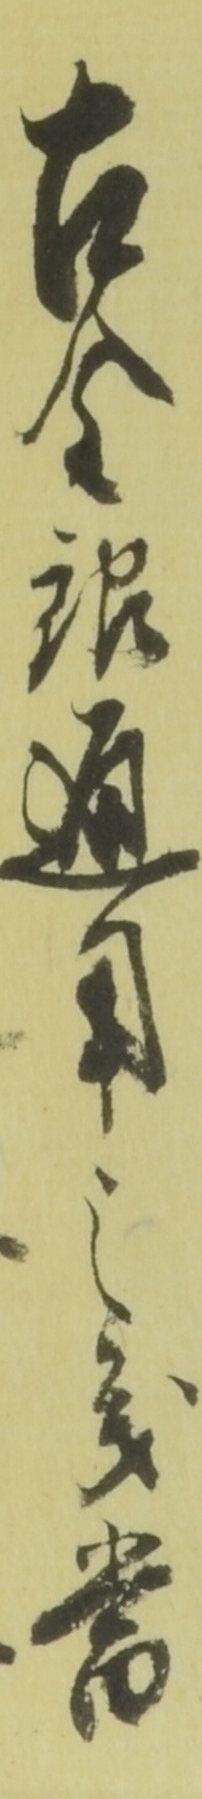古金銀通用之義当
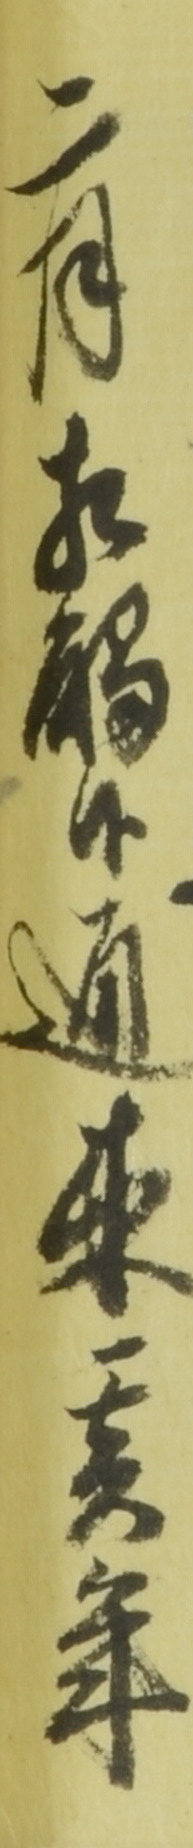二月相触候来亥年
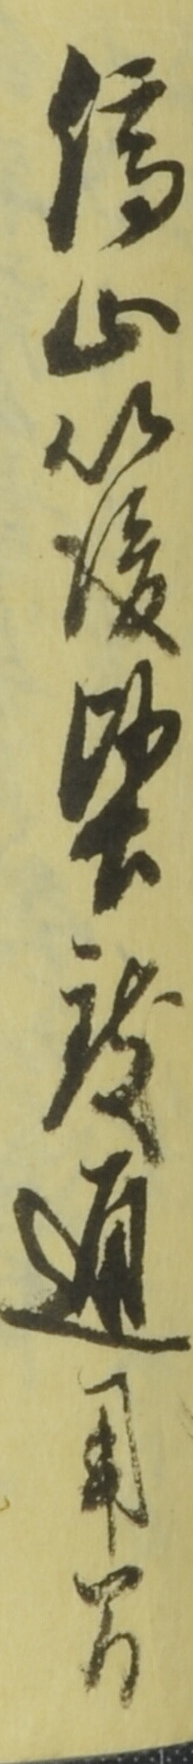停止以後堅致通用間
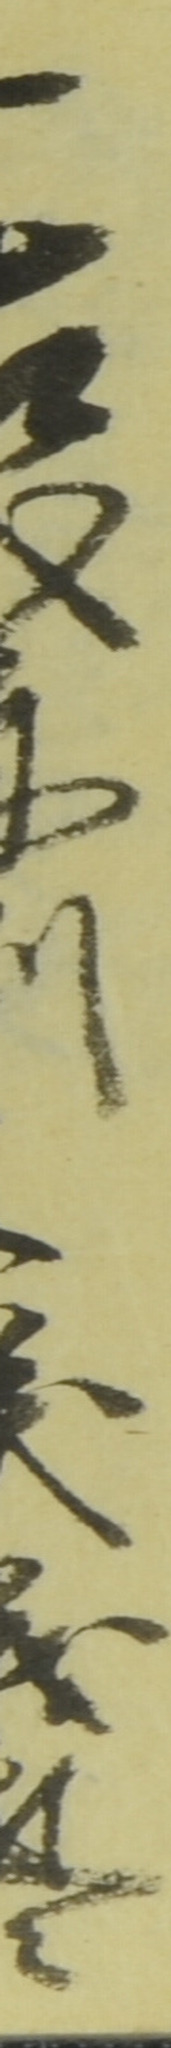一古弐朱判之義も近々

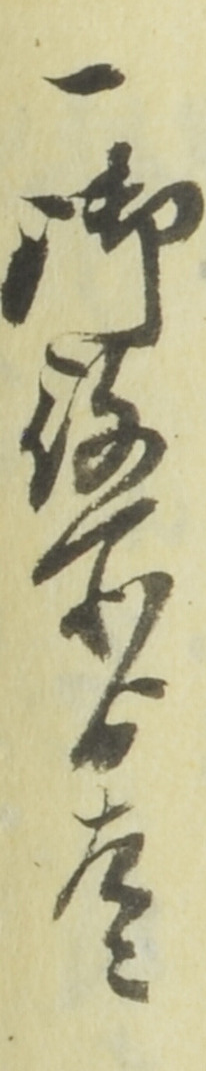一御役所ゟ左ニ
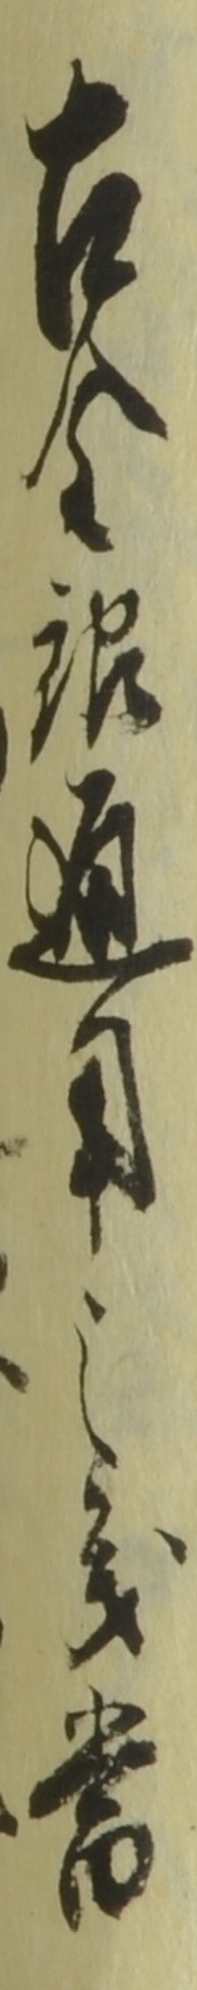古金銀通用之義当
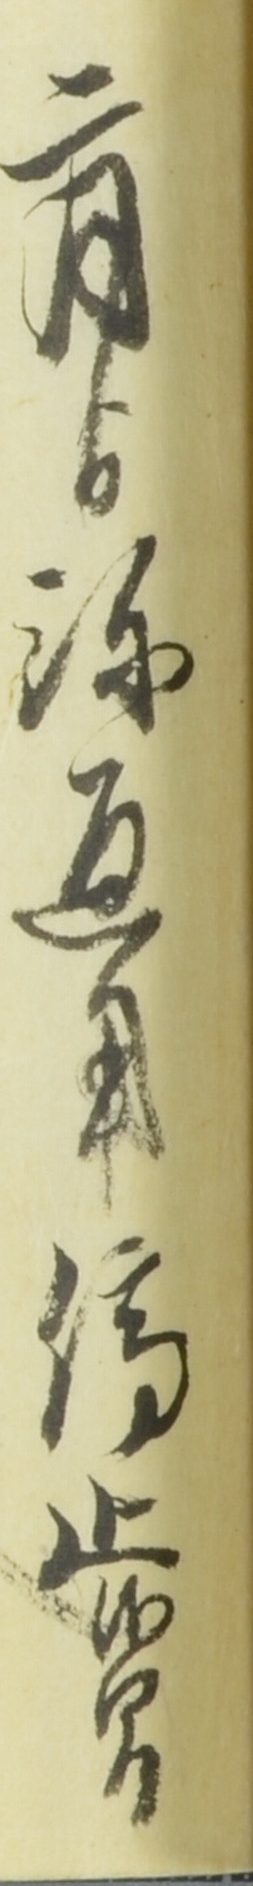二月ゟ弥通用停止候間
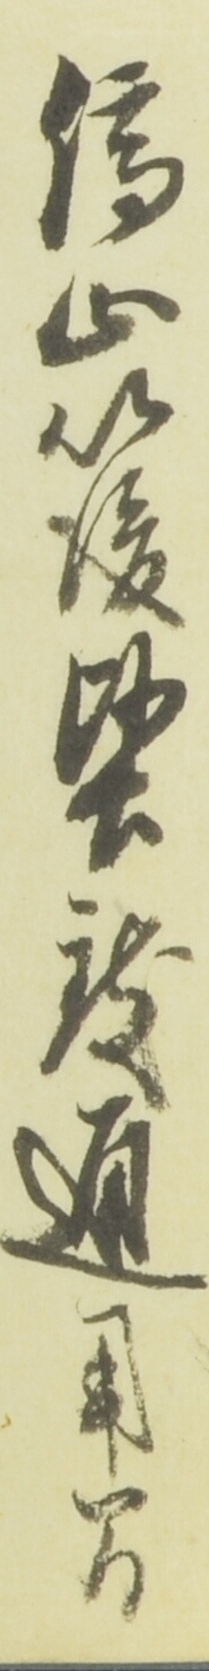停止以後堅致通用間
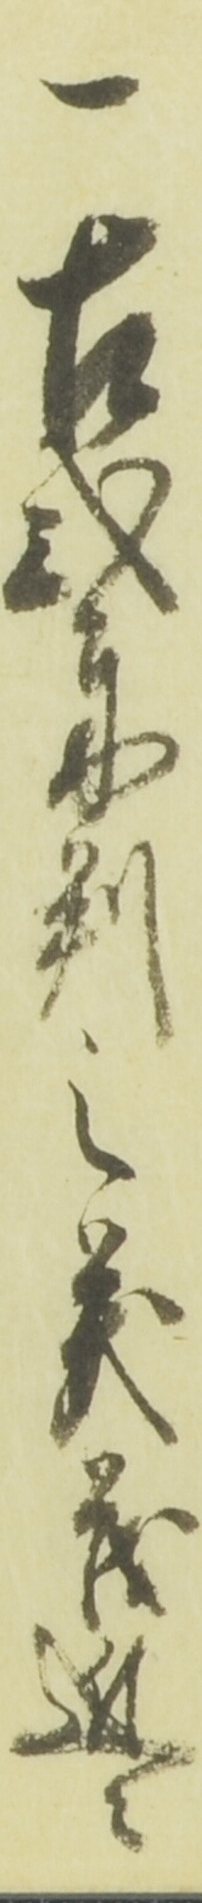一古弐朱判之義も近々
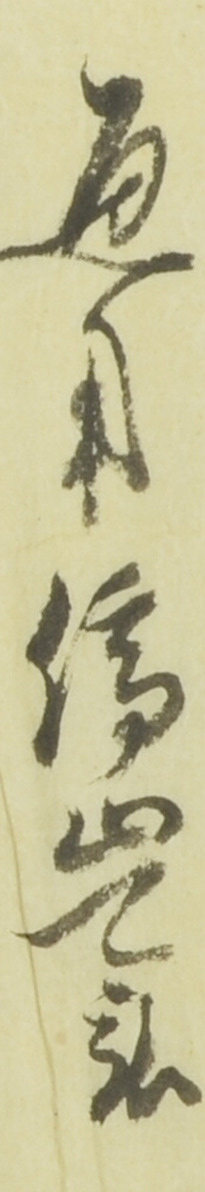通用停止可被
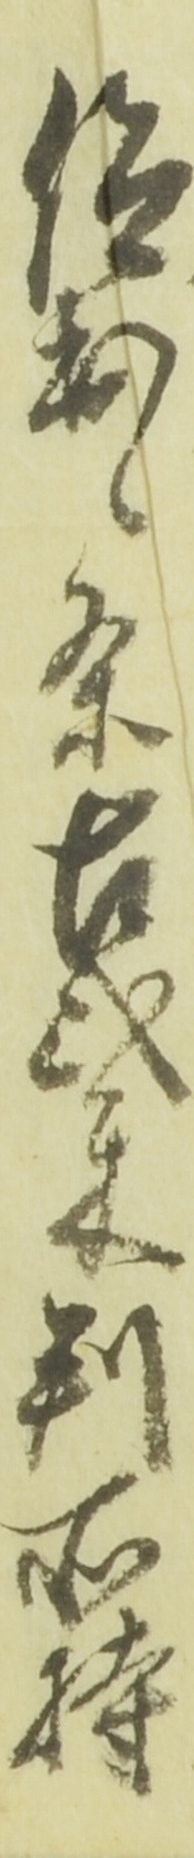仰出候条古弐朱判所持
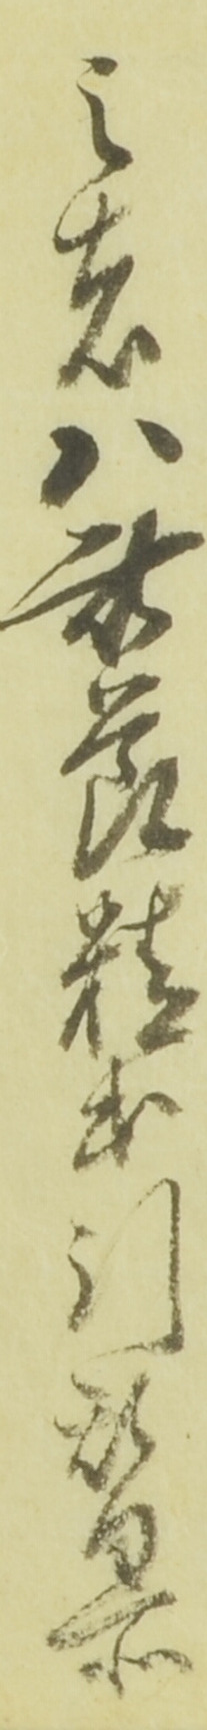之者ハ此節精出引替所
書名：御触書御書附控
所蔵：伊那市立高遠町図書館・合同会社AMANE
